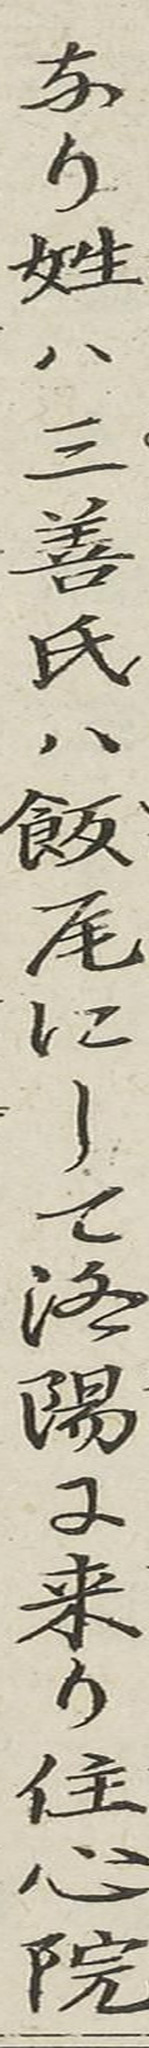なり姓は三善氏は飯尾にして洛陽に来り住心院
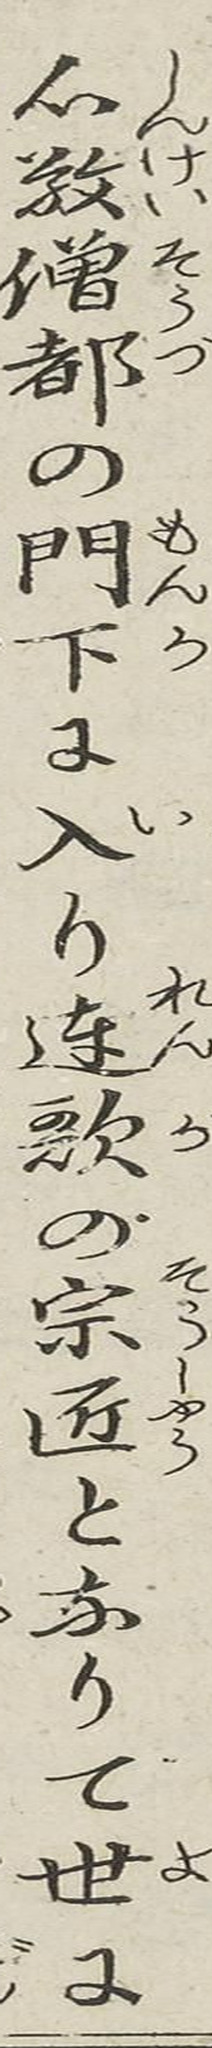心敬僧都の門下に入り連歌の宗匠となりて世に
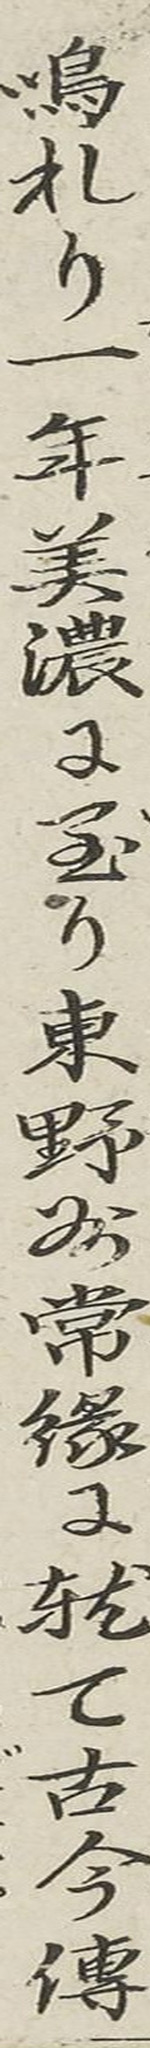鳴れり一年美濃に至り東野州常縁に就て古今傳

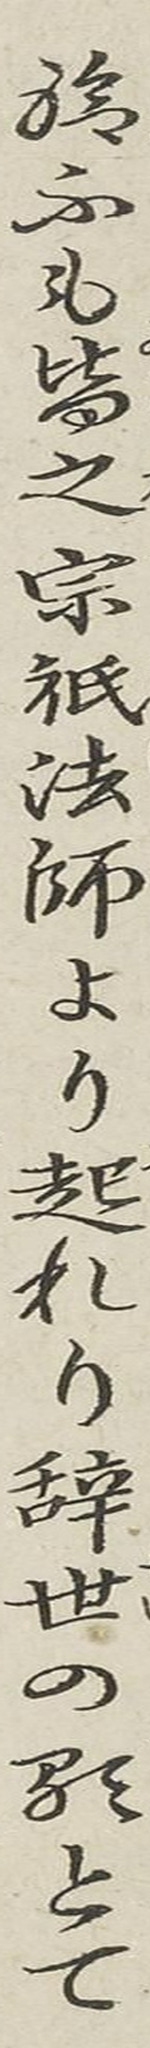給ふも皆之宗祇法師より起れり辞世の歌とて
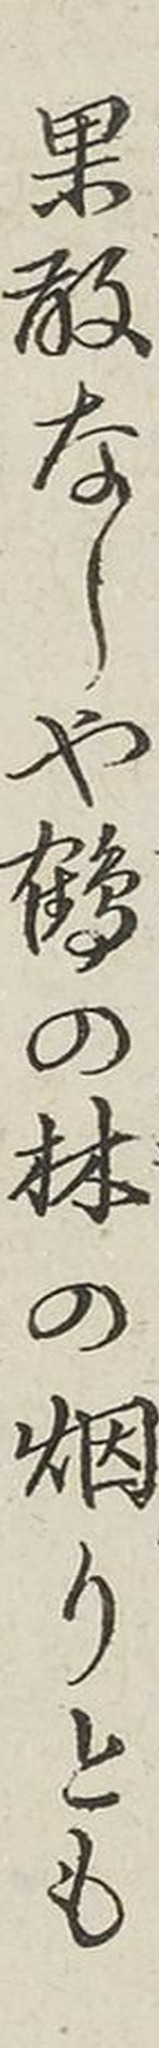果敢なしや鶴の林の煙りとも
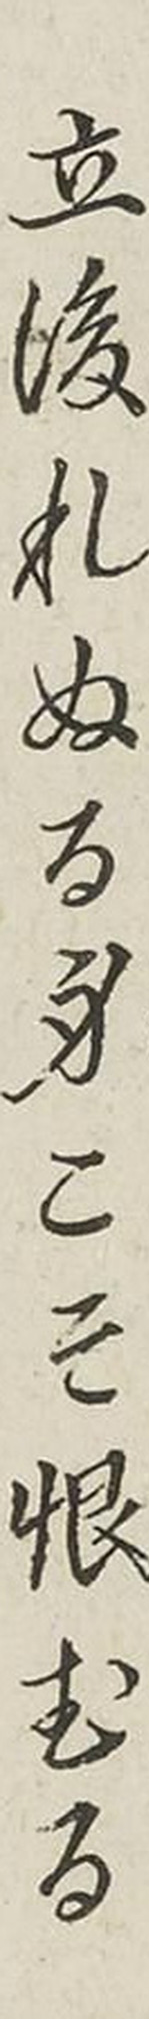立後れぬる身こそ恨むる
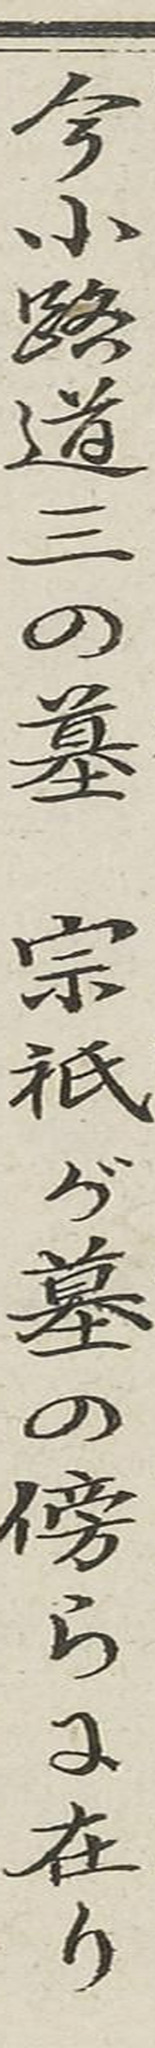今小路道三の墓宗祇が墓の傍らに在り
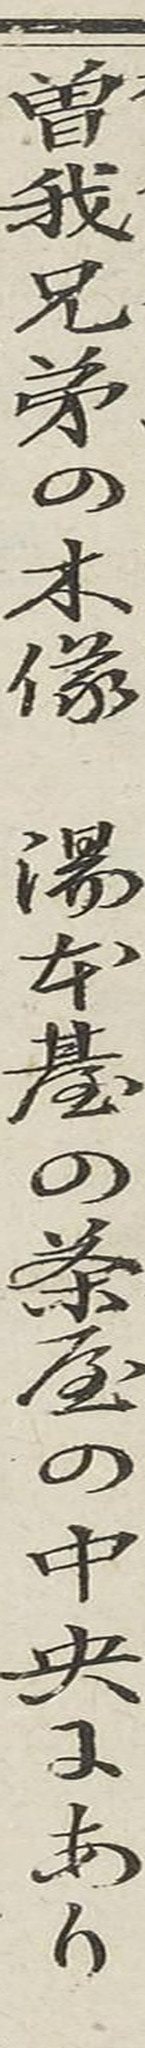曽我兄弟の木像湯本台の茶屋の中央にあり
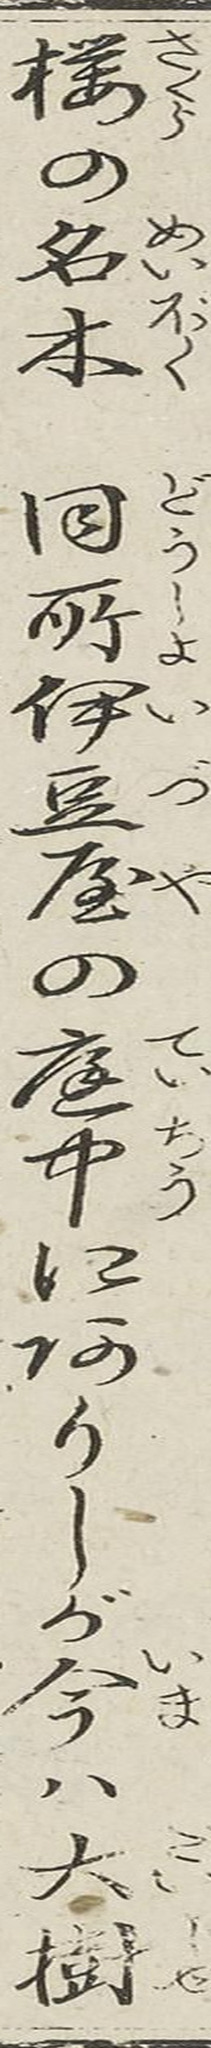桜の名木同所伊豆屋の庭中にありしが今は大樹
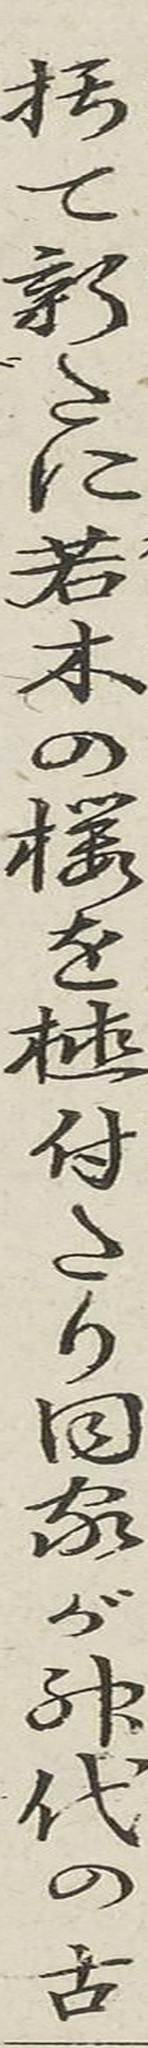朽て新たに若木の桜を植付たり同家が神代の古
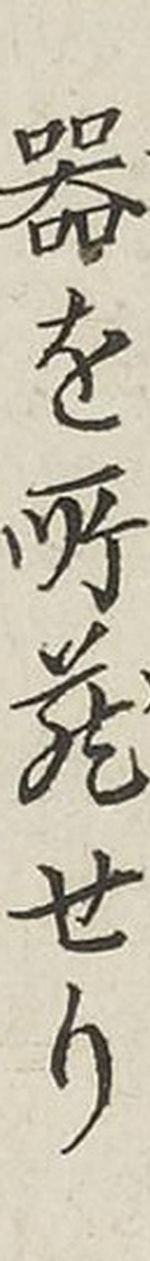器を所蔵せり
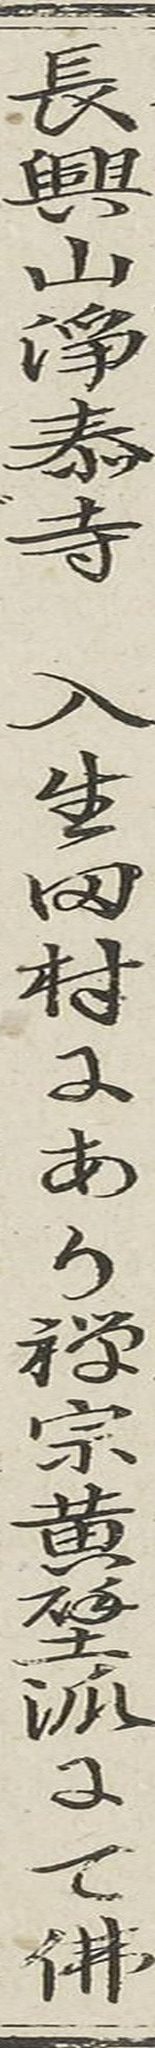長興山浄泰寺入生田村にあり禅宗黄檗派にて仏
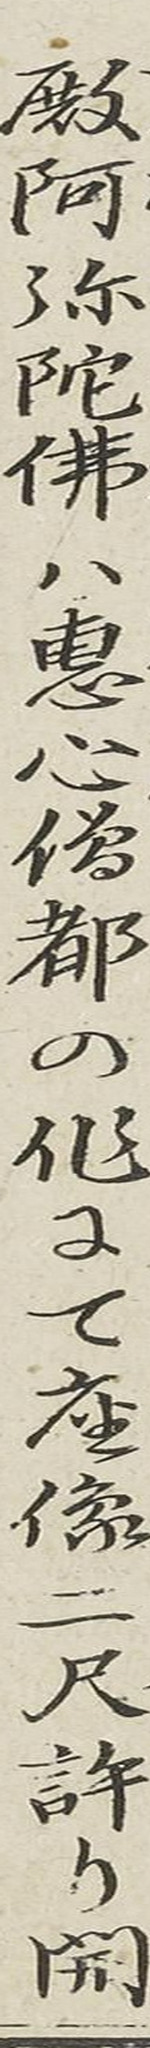殿阿弥陀仏は恵心僧都の作にて座像二尺許り開
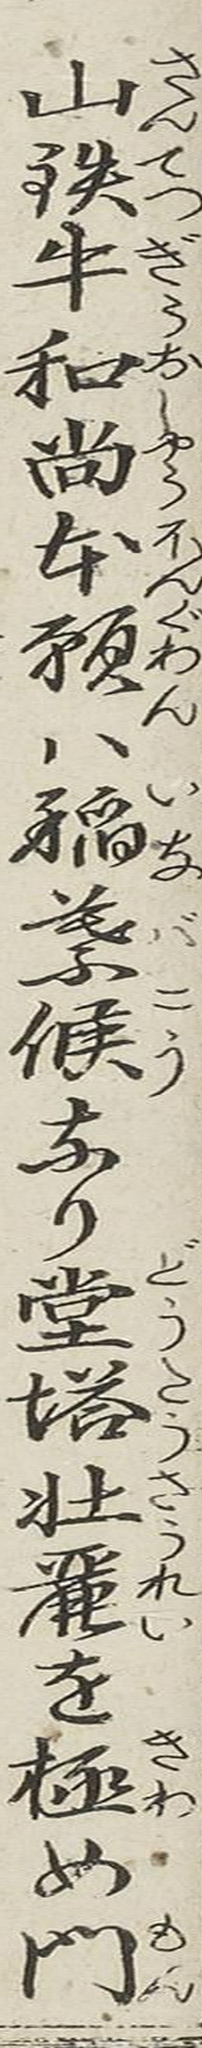山鉄牛和尚本願は稲葉候なり堂塔壮麗を極め門
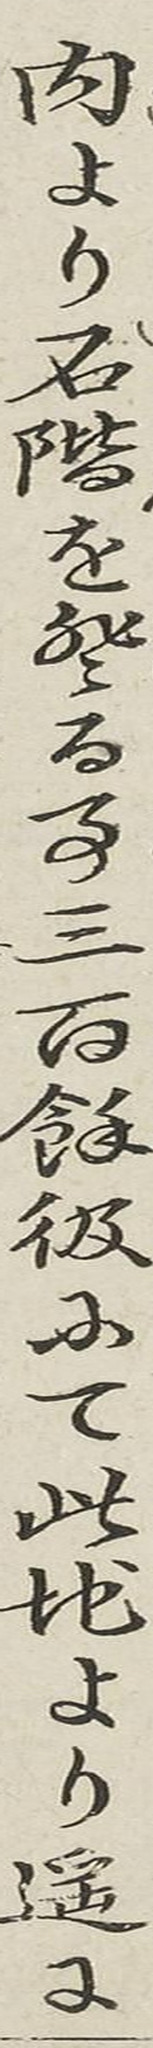内より石階を登る事三百餘彶にて此地より遥に
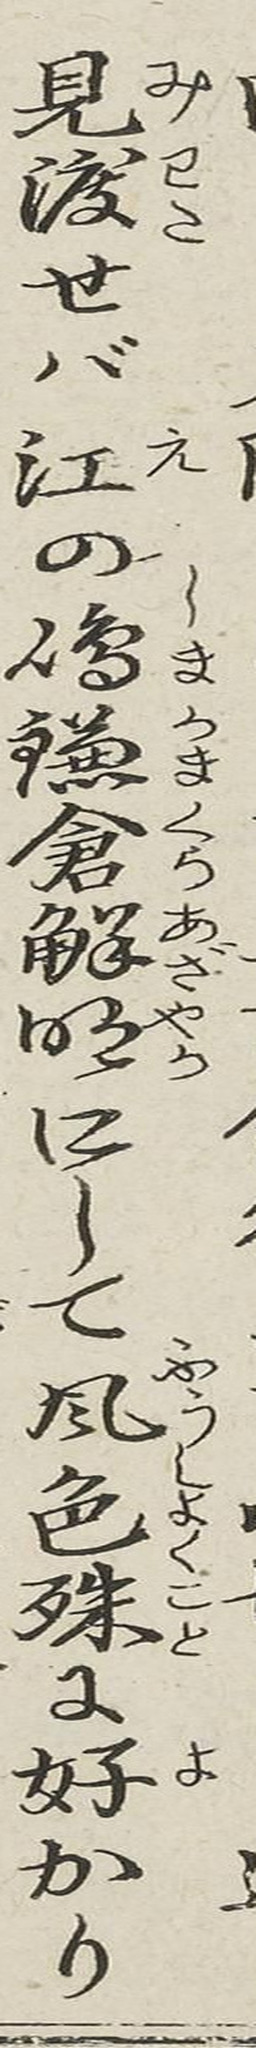見渡せば江の嶋鎌倉鮮明にして風色殊に好かり
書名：箱根温泉誌　全
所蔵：東京大学地震研究所図書室 Earthquake Research Institute Library, The University of Tokyo, JAPAN
